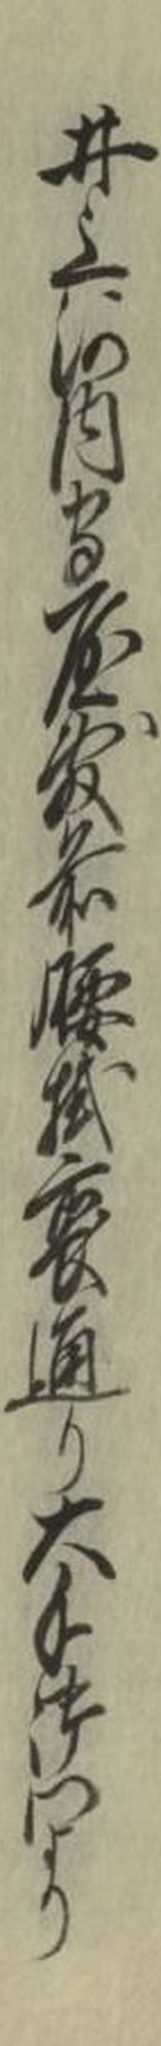井上河内守屋敷前腰掛裏通り大手御門より
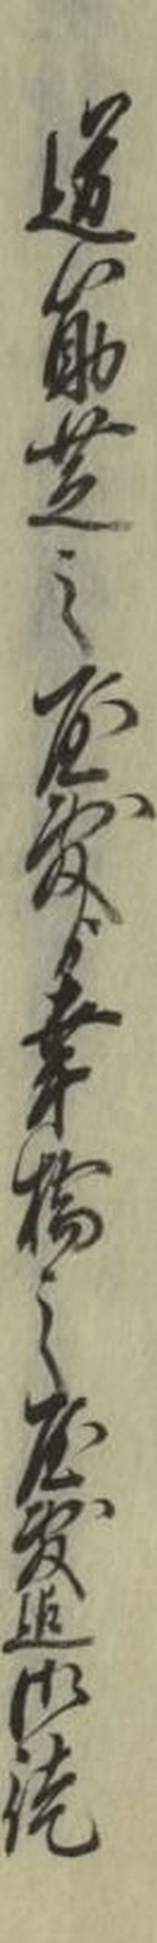道筋芝之屋敷ゟ幸橋之屋敷迄御徒
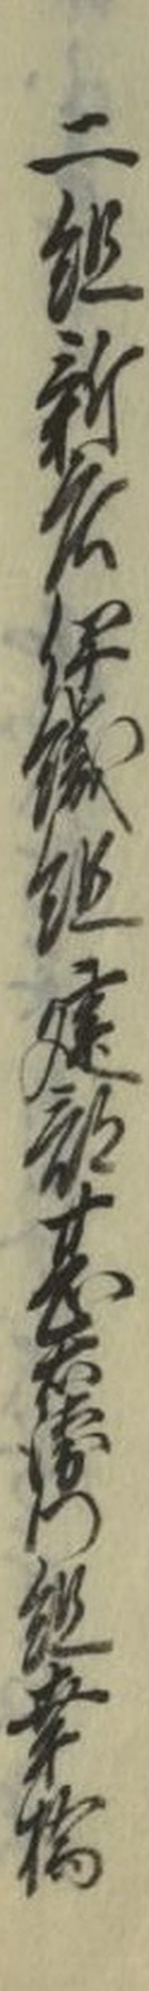二組新庄伊織組建部甚右衛門組幸橋
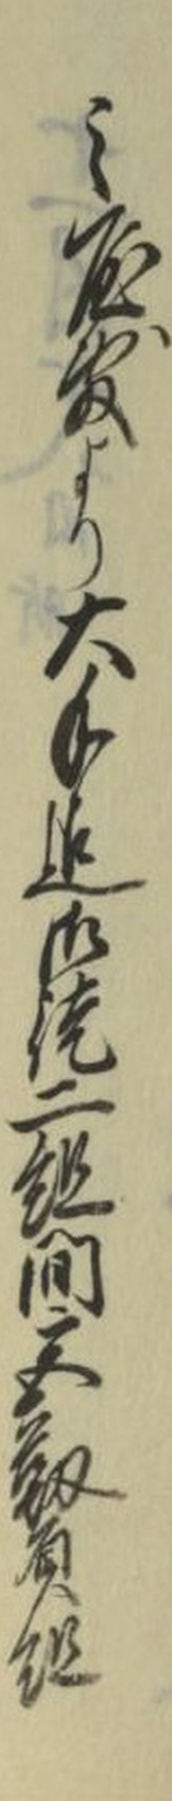之屋敷より大手迄御徒二組間宮靭負組
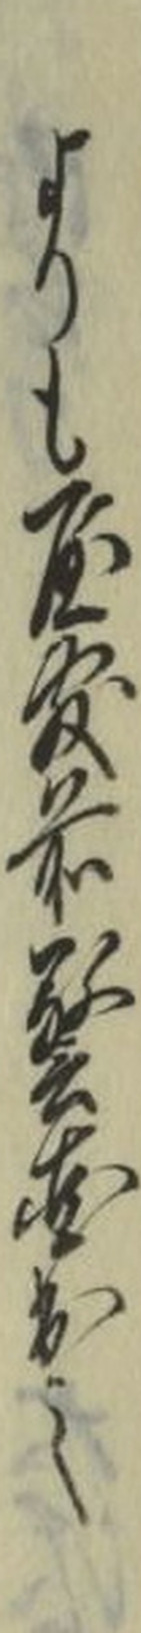よりも屋敷前警固出之
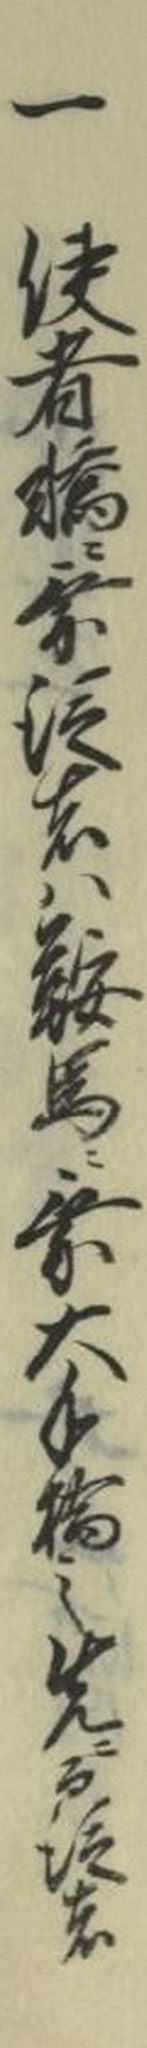一使者轎に乗従者は鞍馬に乗大手橋之先に而従者
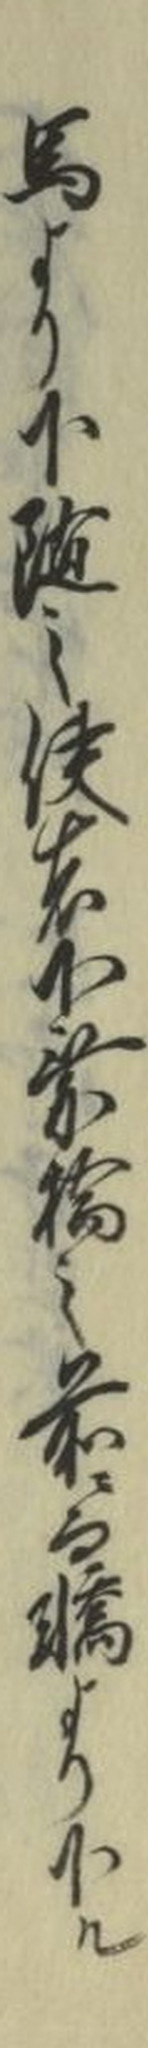馬より下随之使者不乗橋之前に而轎より下る
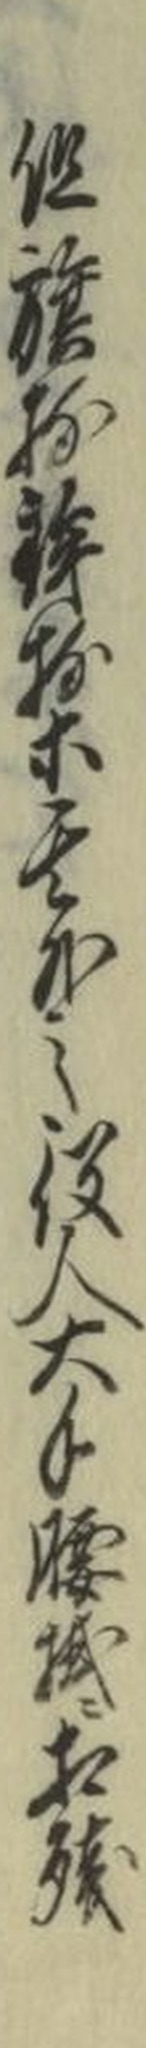但旗持鉾持等其外之役人大手腰掛に相残
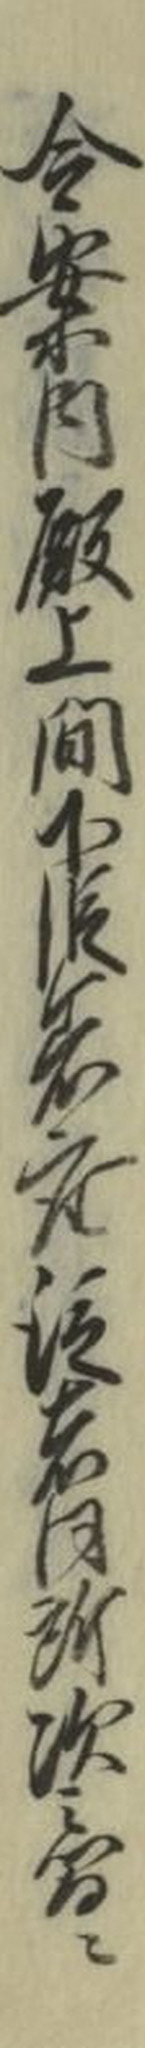令案内殿上間下段着座従者同所次之間に
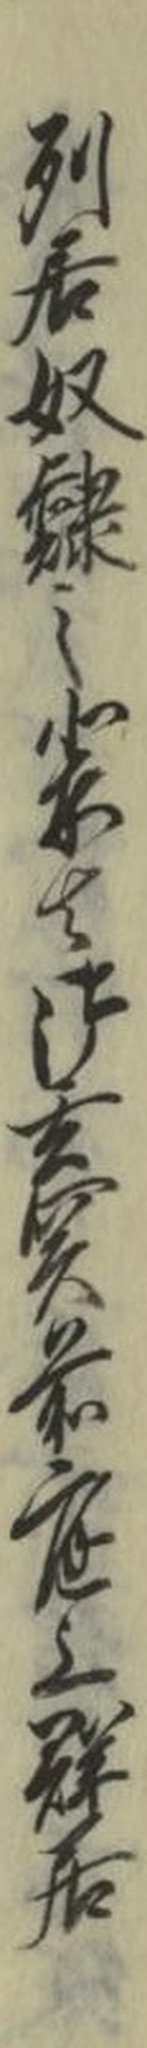列居奴隷之輩は御玄関前庭上群居

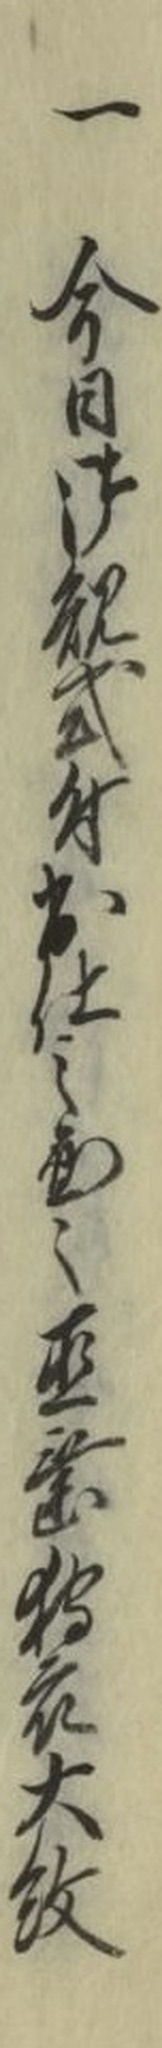一今日御規式付出仕之面々直垂狩衣大紋
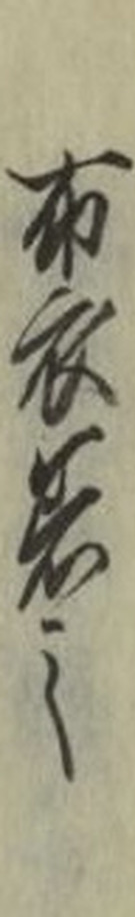布衣着之
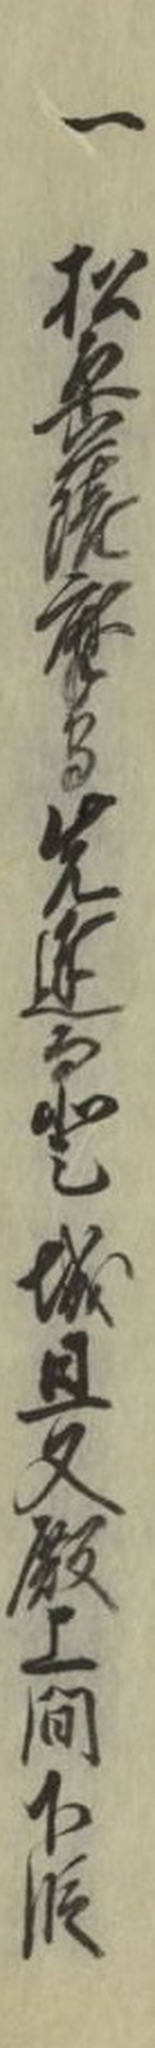一松平薩摩守先達而登城且又殿上間下段
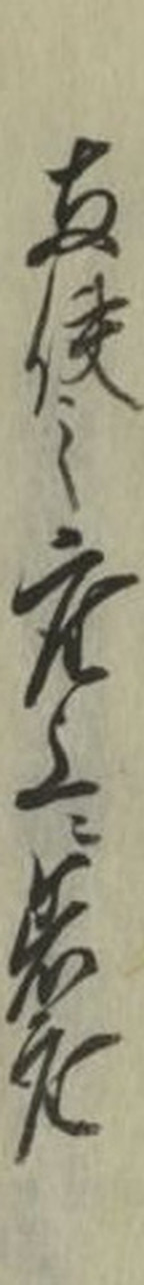両使之座上に着座
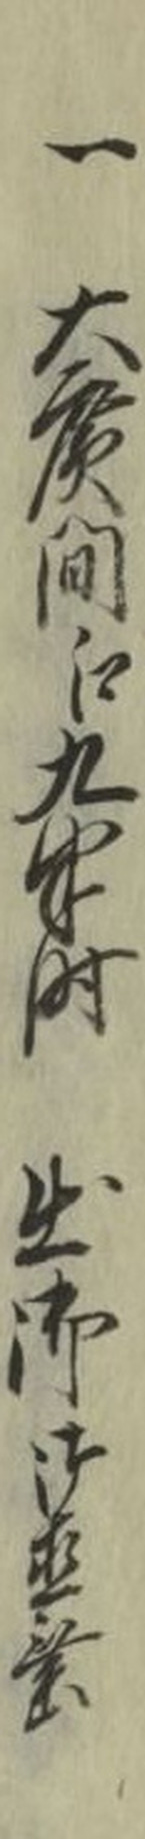一大広間え九半時出御御直垂
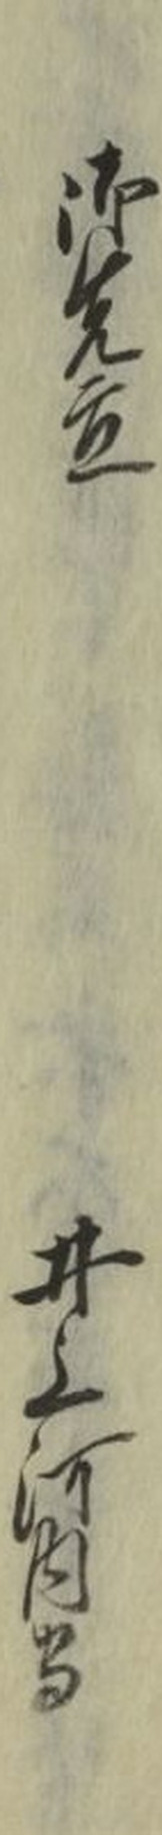御先立井上河内守
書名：琉球人参府記
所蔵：University of the Ryukyus Library
